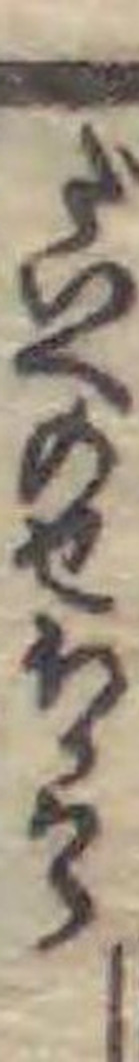だいへのせほかから
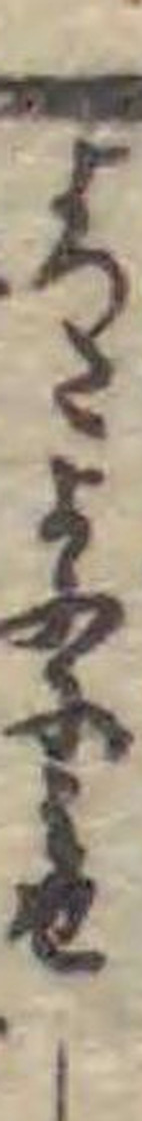よつたよふにみせ
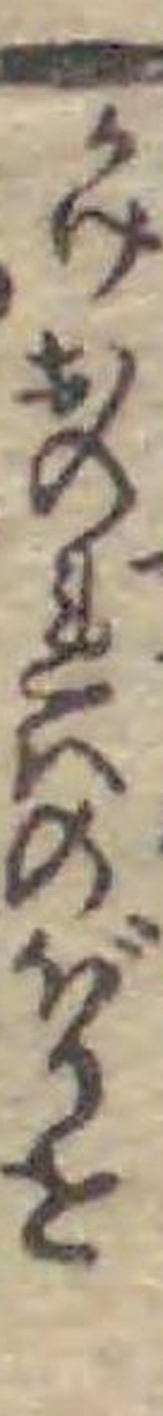かけおのれはのぼりを
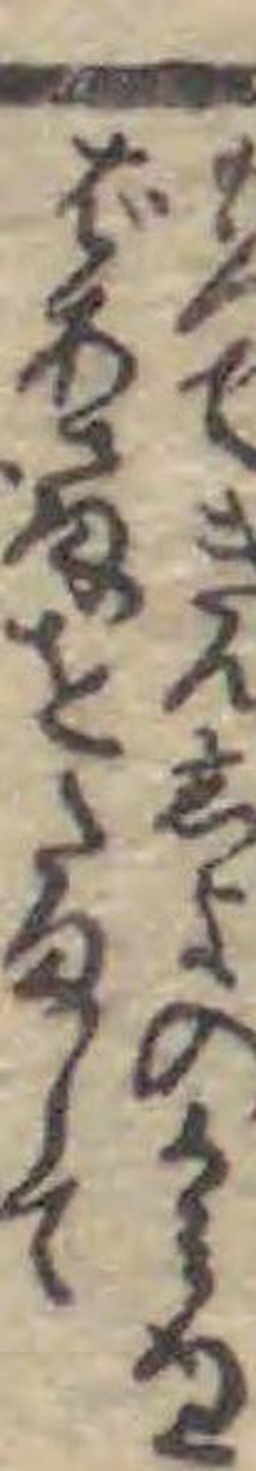ばあさまをたまして
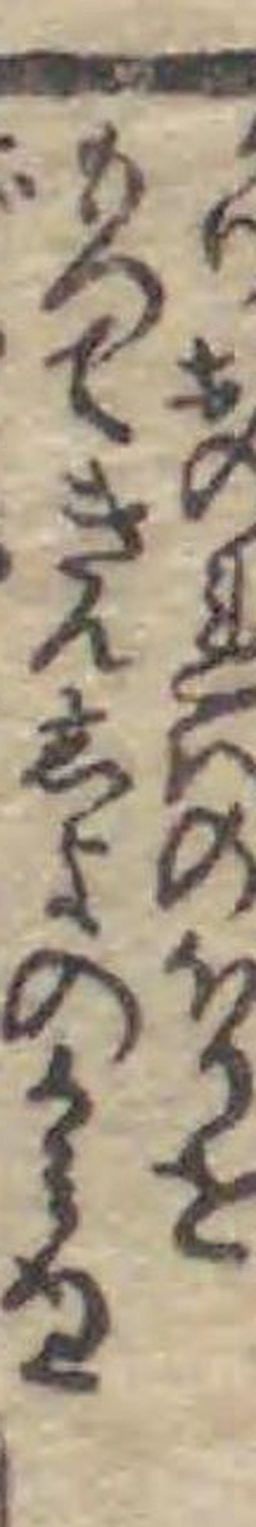もつてきんしよのかみ様
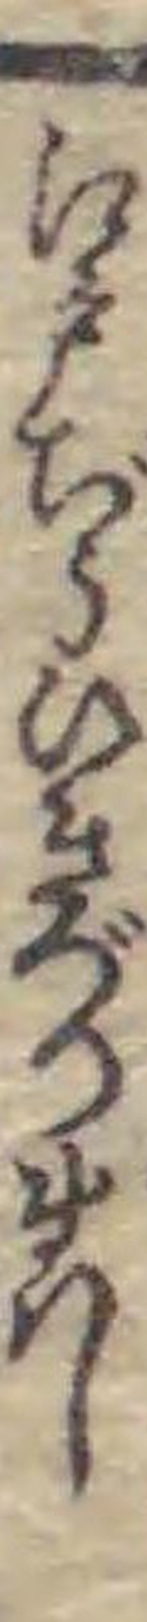江戸ぢうひきづりまはし
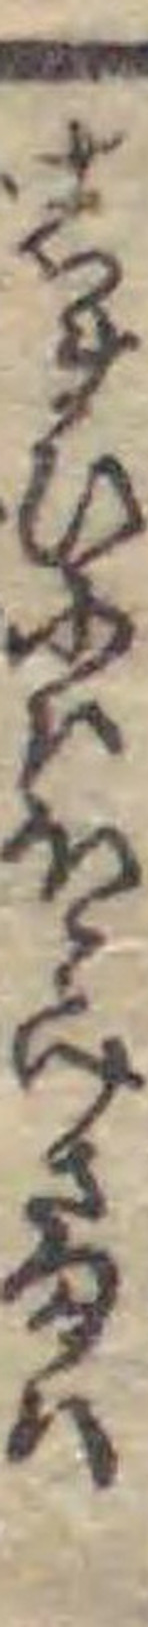しまひにはほとけさまは
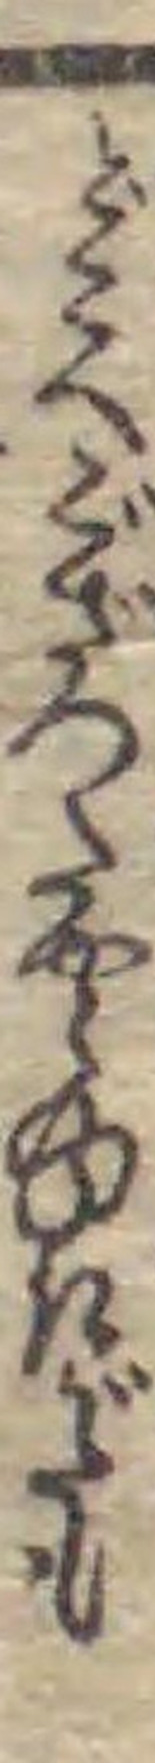どこへござつたやらゆきがたも
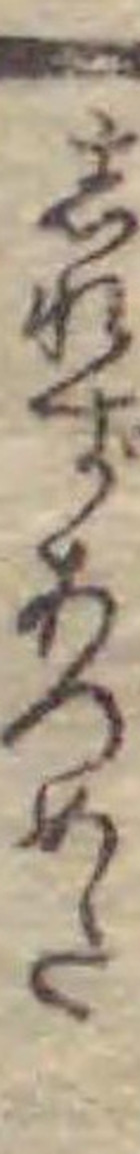しれずあつめた
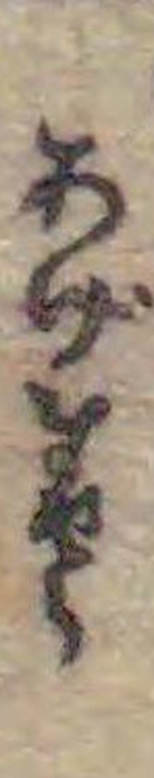あげませう
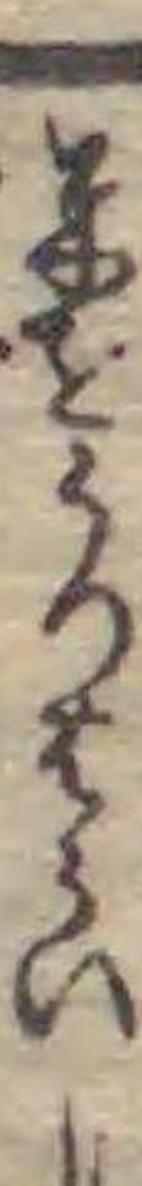米をうりはらい
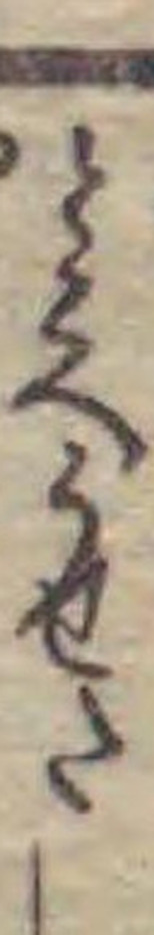とこへうせた
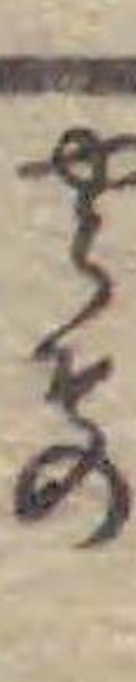やらその
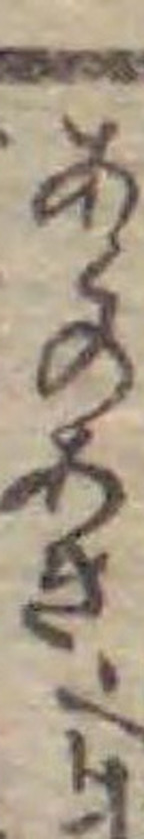あとのあき
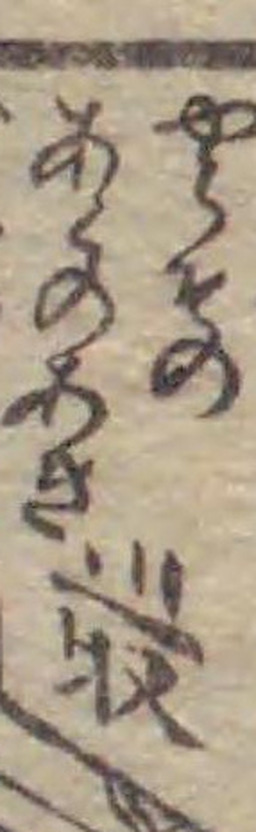あとのあき
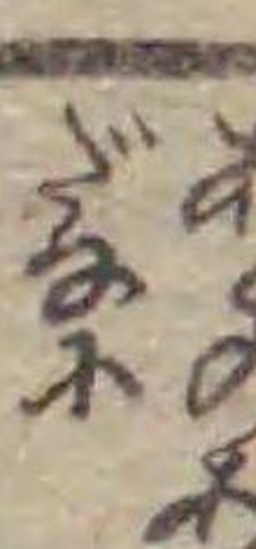だなに
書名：紙屑身上噺 : 3巻
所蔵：国立国会図書館 National Diet Library, JAPAN
